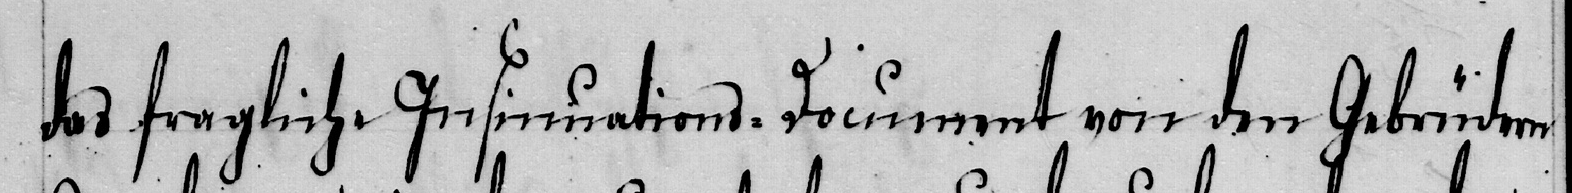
das fragliche Insinuations-Docuent von den Gebrüdern
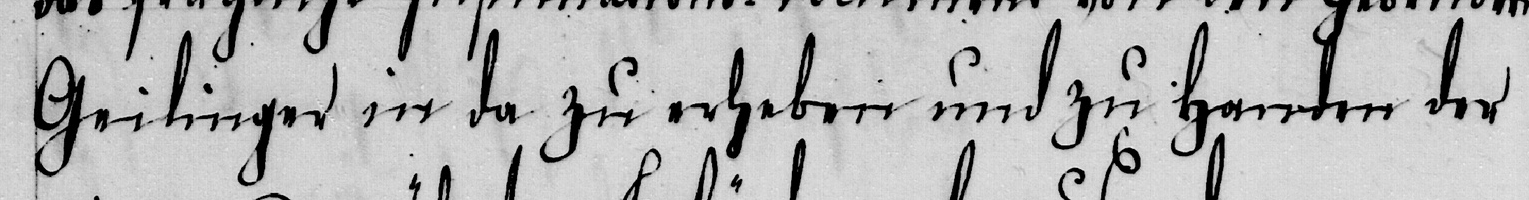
Geilinger in da zu erheben und zu Handen der
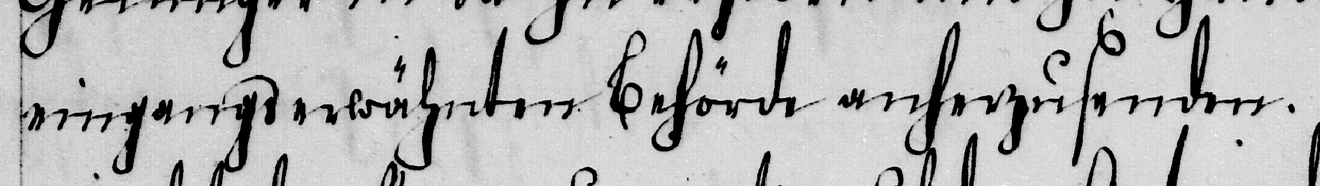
eingangs erwähnten Behörde anherzusenden.
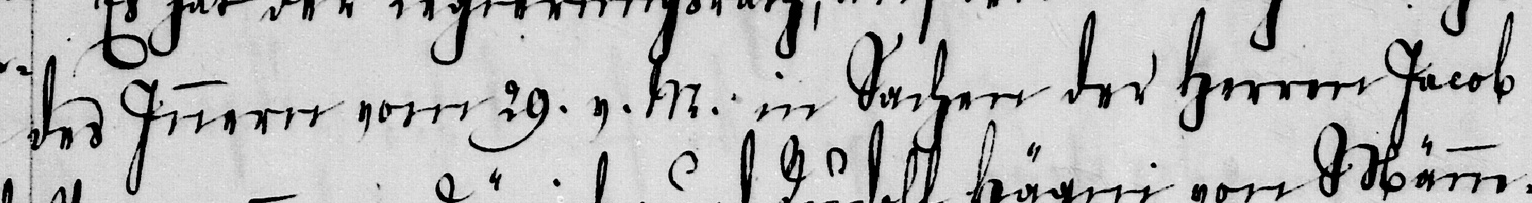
des Innern vom 29. v. M. in Sachen der Herren Jacob
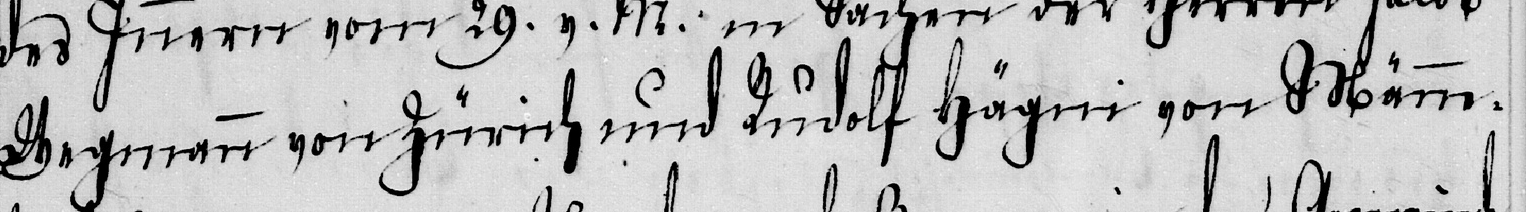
Wegmann von Zürich und Rudolf Hägni von Männe¬
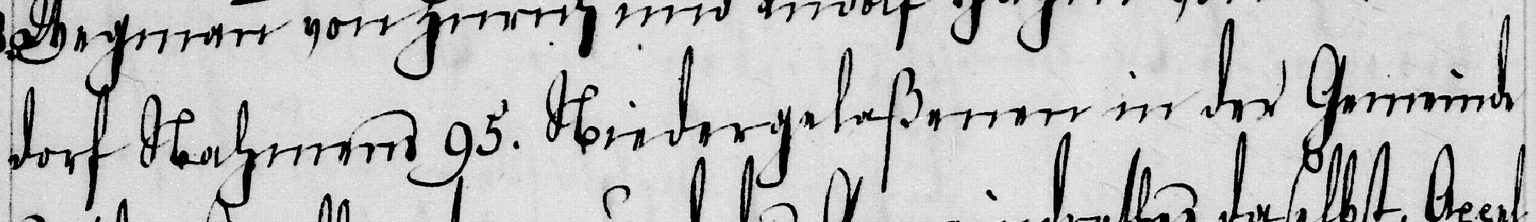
dorf Nahmens 95. Niedergelaßenen in der Gemeinde
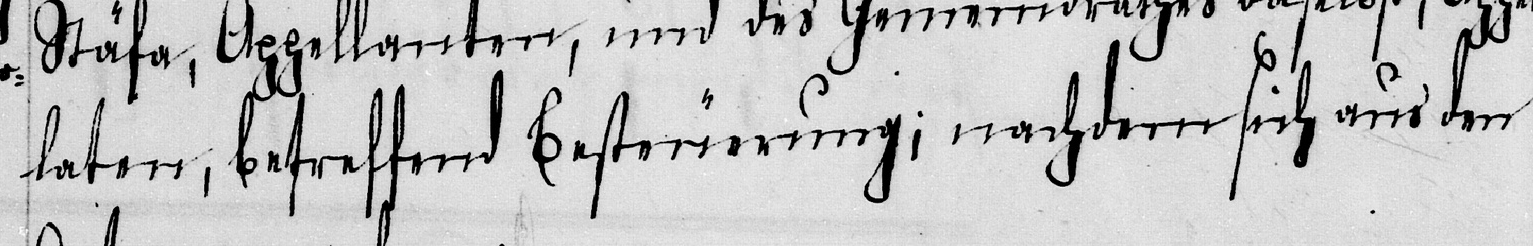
elaten, betreffend Besteuerung; nachdem sich aus den
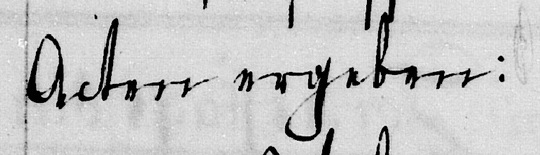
Acten ergeben:
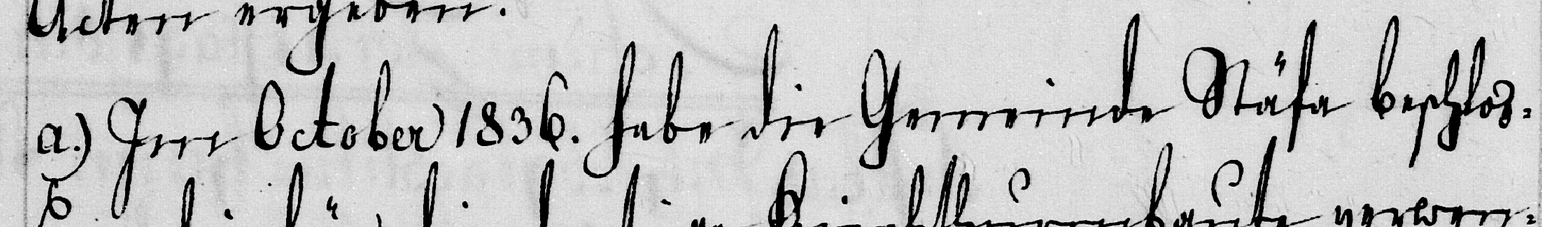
a.) Im October 1836. habe die Gemeinde Stäfa beschlo¬
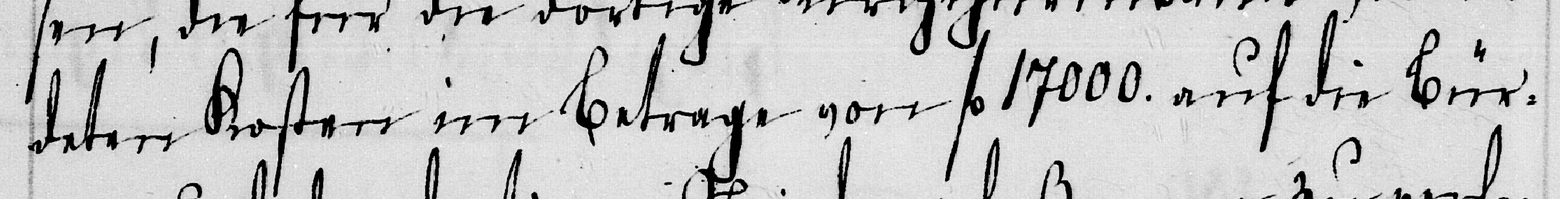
deten Kosten im Betrage fl. 17000. auf die Bür¬
